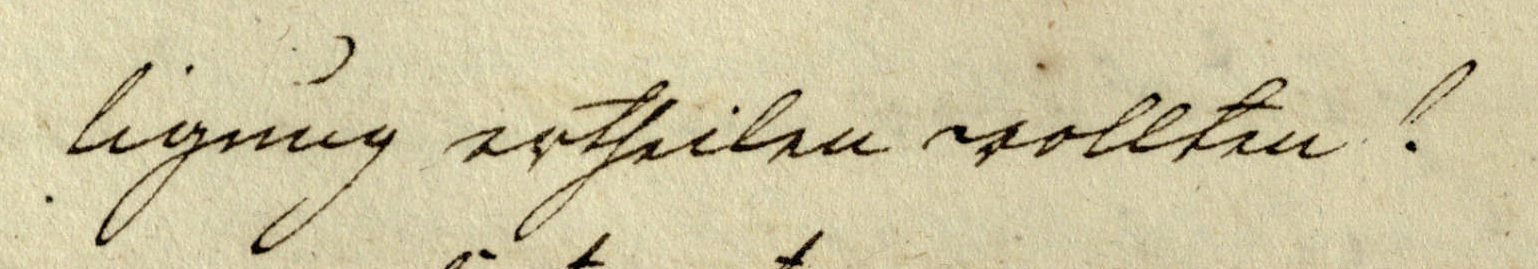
ligung ertheilen wollten?
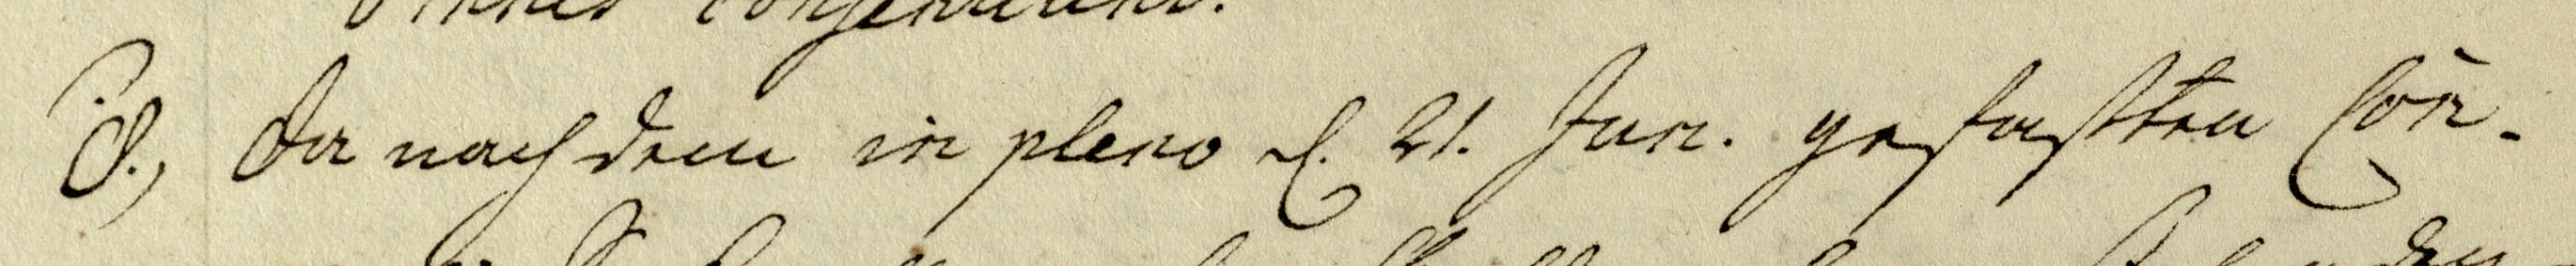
8., Da nach dem in pleno d. 21. Jun. gefaßten Con¬
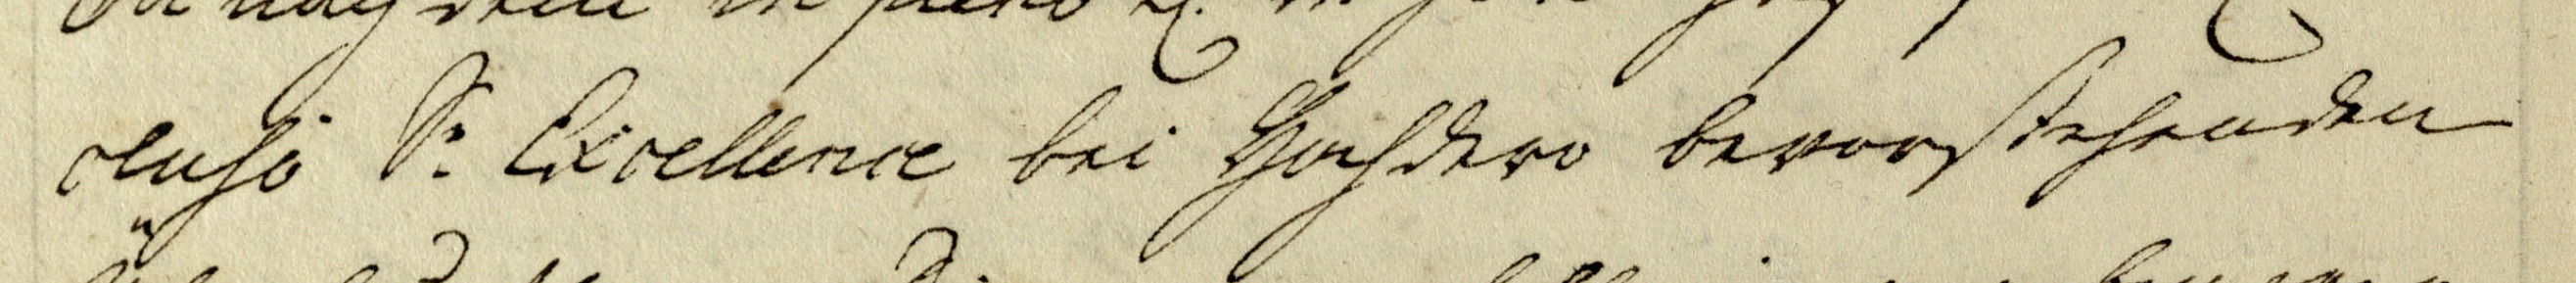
clusi Sr. Excellence bei Hochdero bevorstehenden
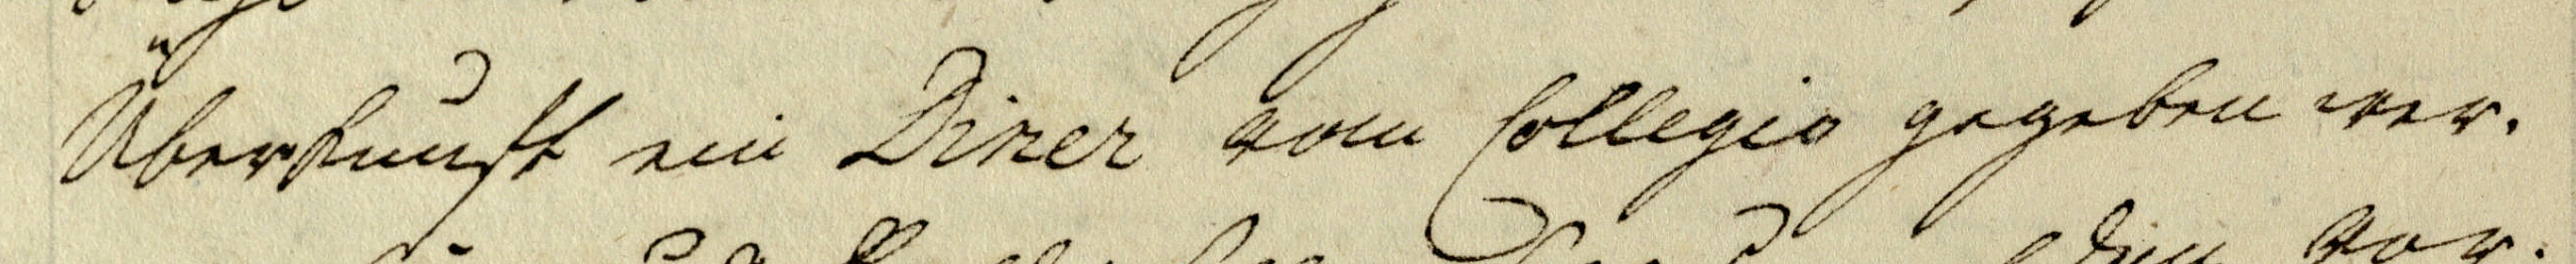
Überkunft ein Diner vom Collegio gegeben wer¬
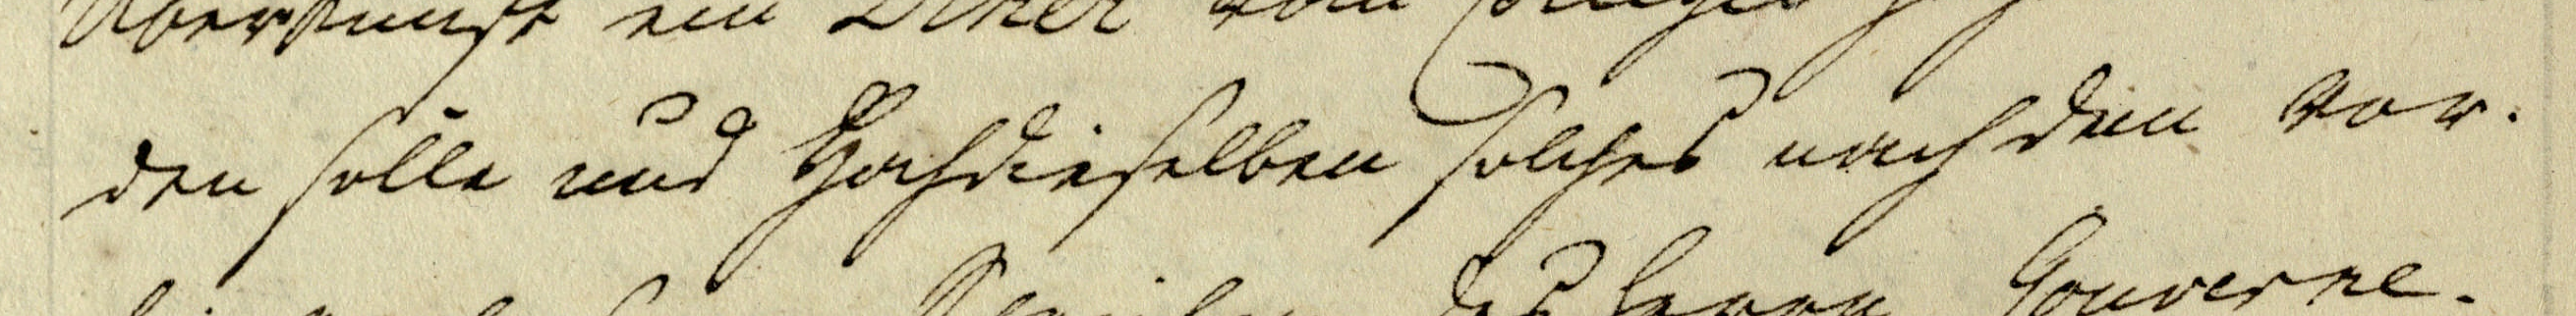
den solle und Hochdieselben solches nach dem vor¬
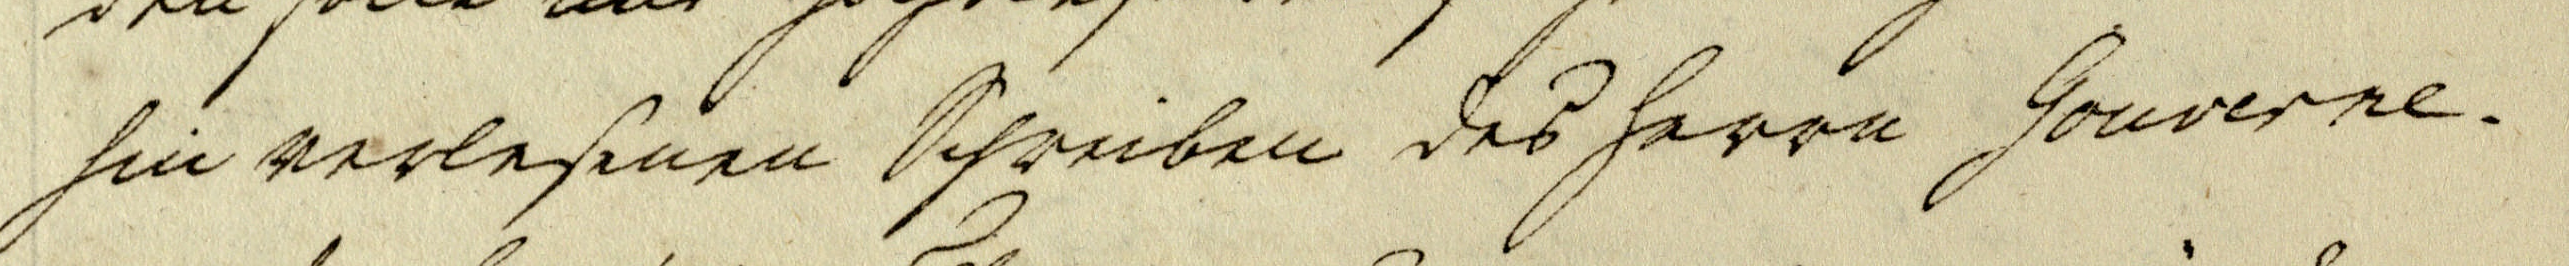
hin verlesenen Schreiben des Herrn Gouverne¬
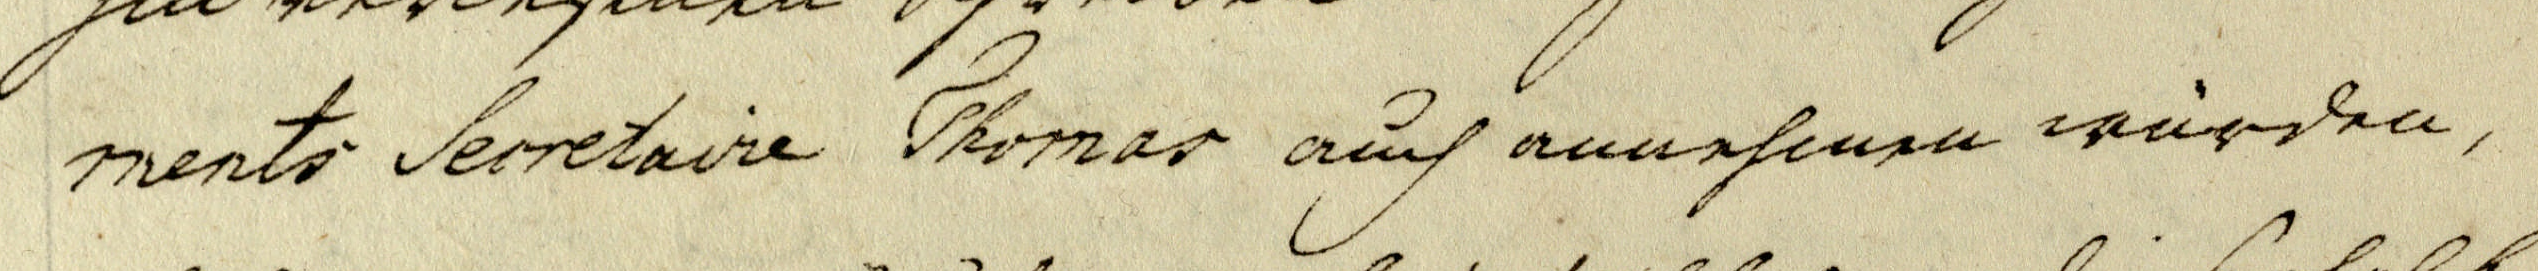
ments Secretaire Thomas auch annehmen würden,
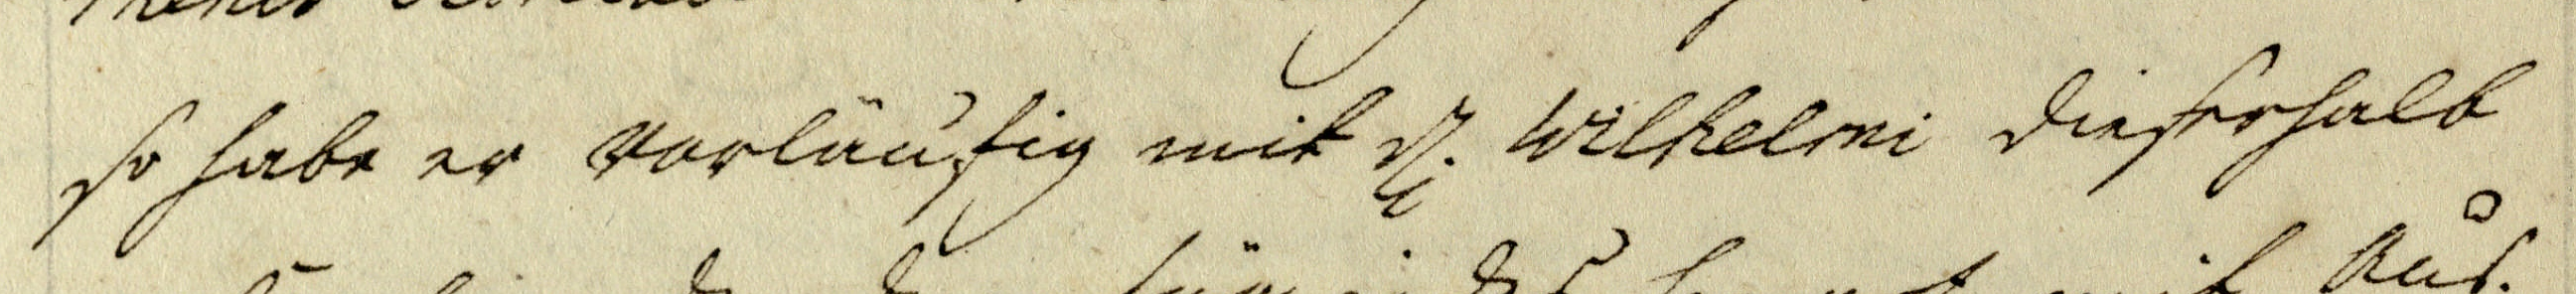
so habe er vorläufig mit dh. Wilhelmi dieserhalb
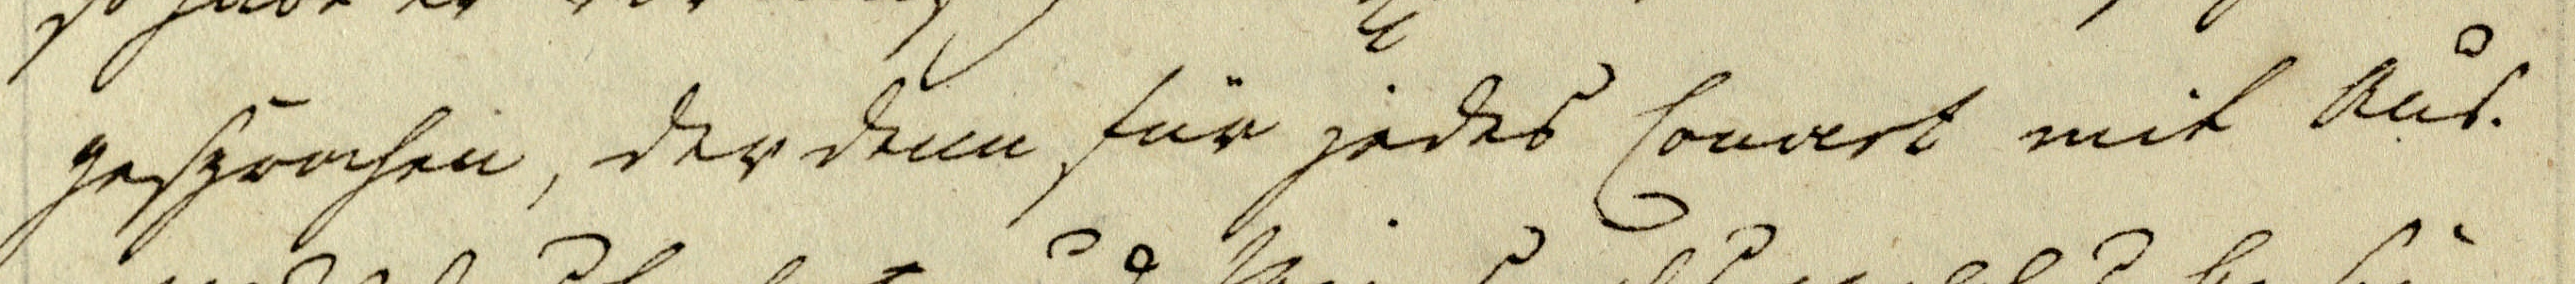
gesprochen, der denn für jedes Couvert mit Aus¬
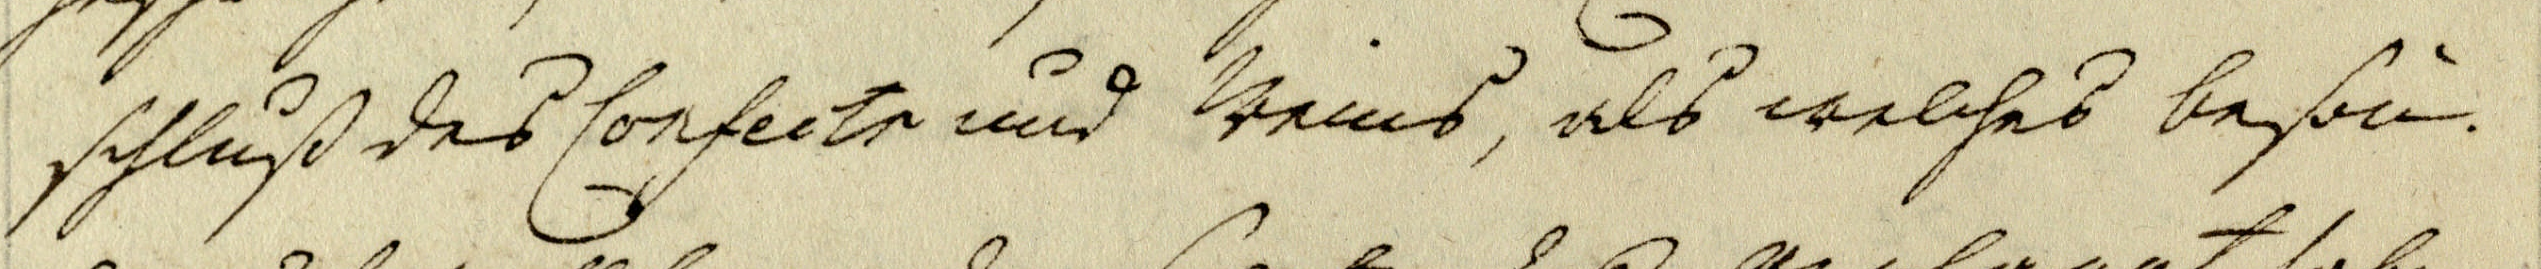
schluß des Confects und Weins, als welches beson¬
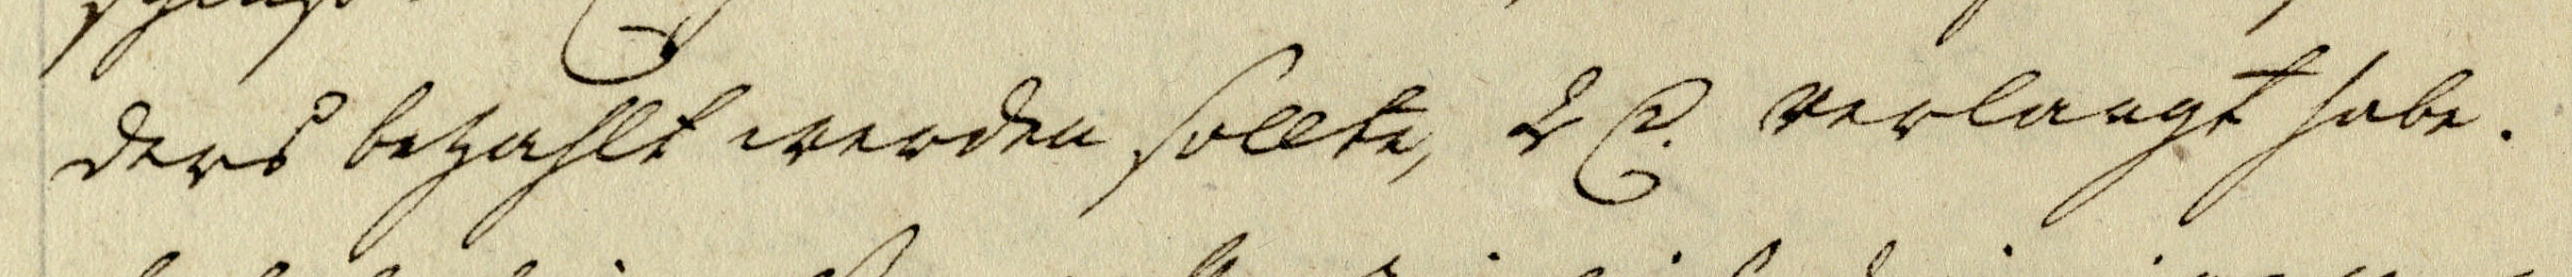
ders bezahlt werden sollte, 2 l. verlangt habe.
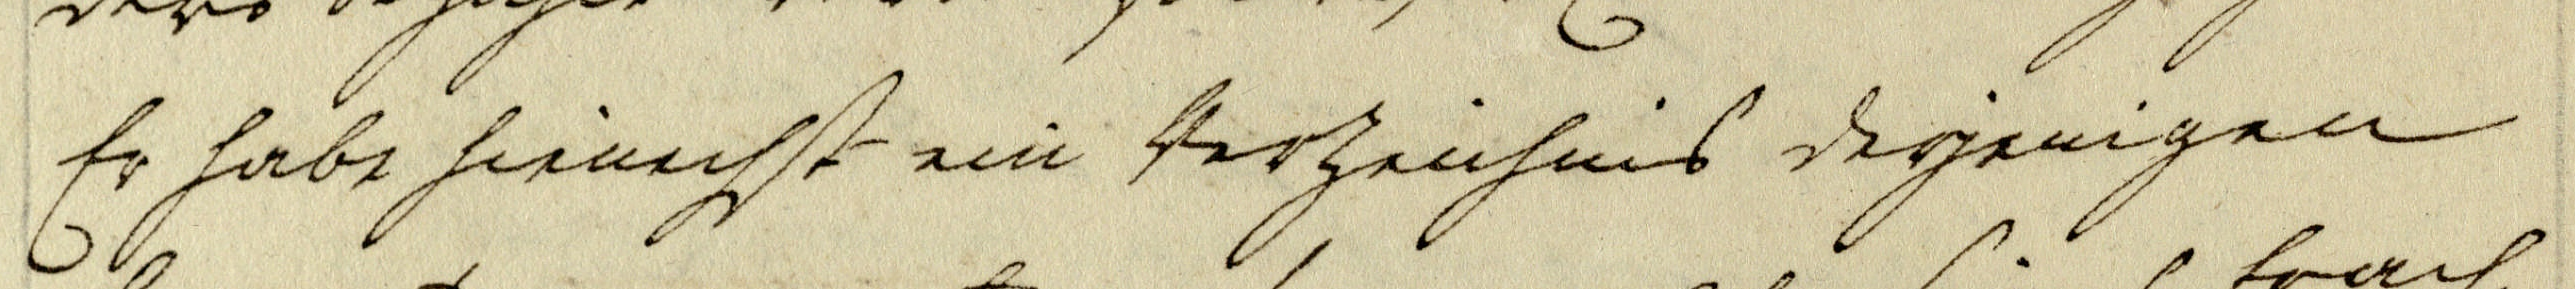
Er habe hienechst ein Verzeichnis derjenigen
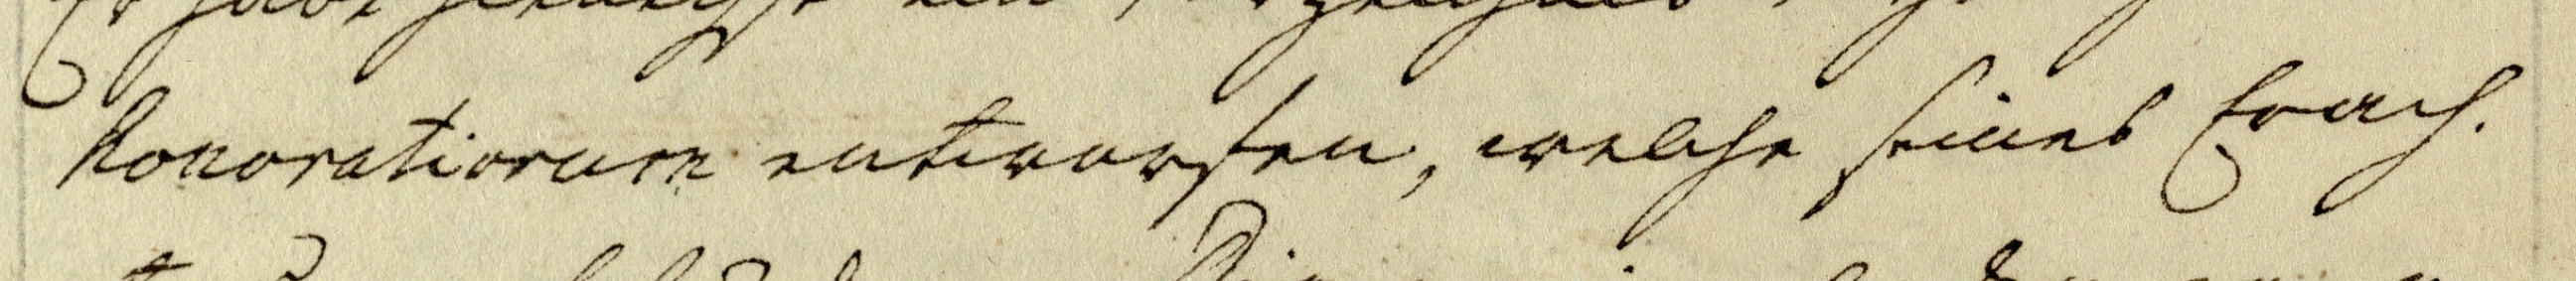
honoratiorum entworfen, welche seines Erach¬
